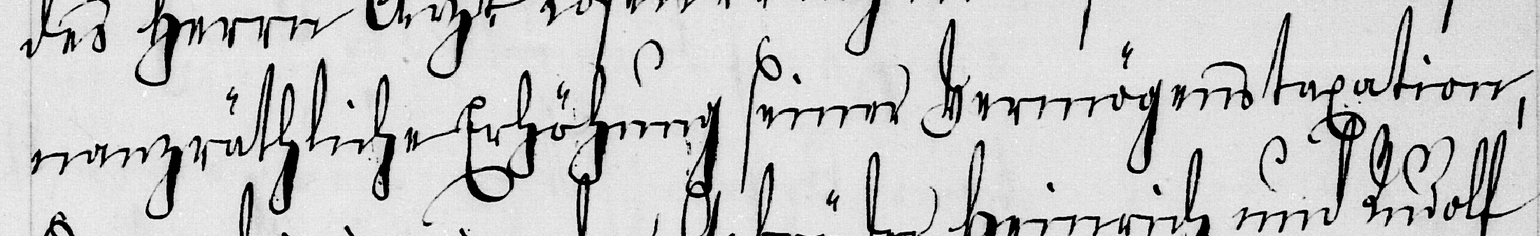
nanzräthliche Erhöhung seiner Vermögenstaxation,
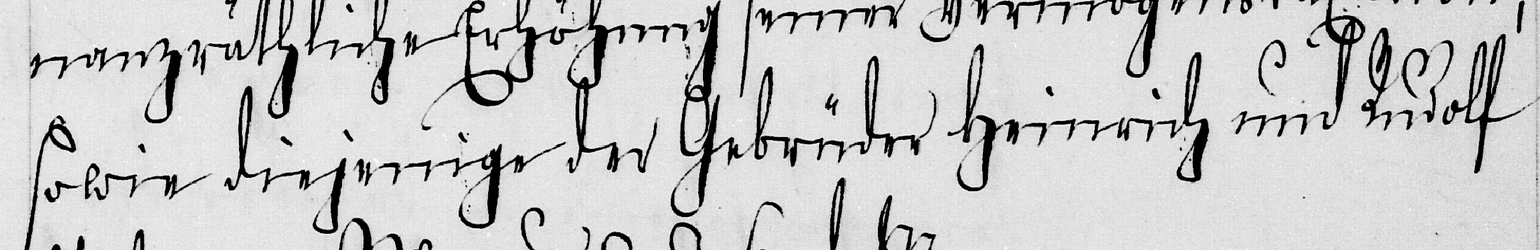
sowie diejenige der Gebrüder Heinrich und Rudolf
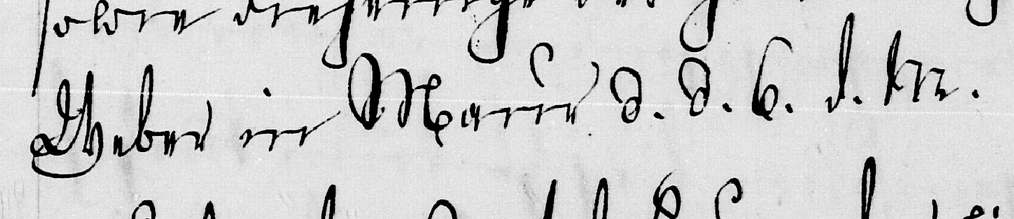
Weber in Maur d. d. 6. d. M.
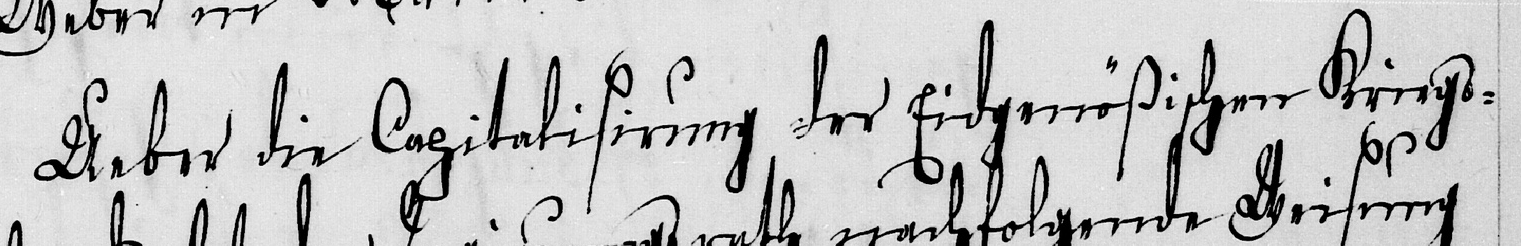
Ueber die Capitalisirung der Eidgenößischen Kriegs¬
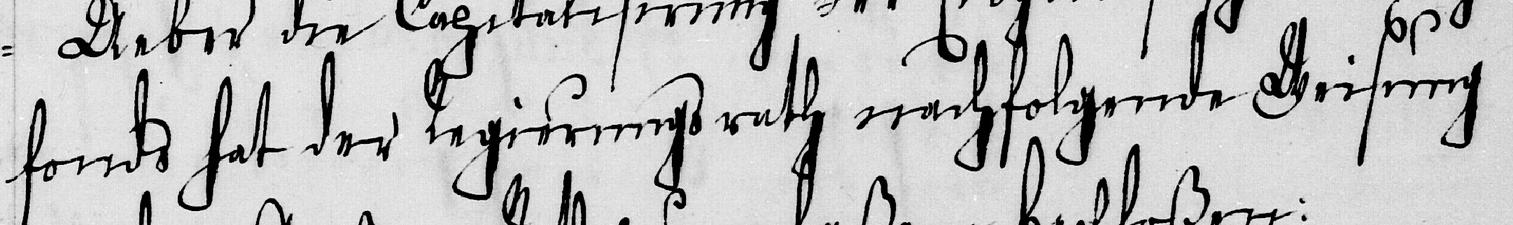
fonds hat der Regierungsrath nachfolgende Weisung
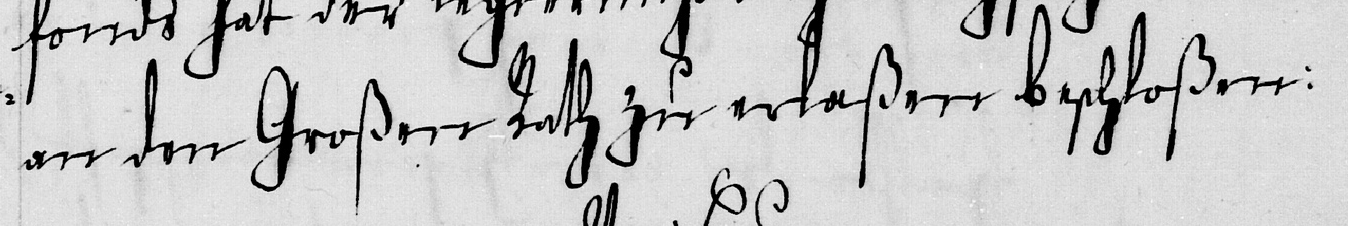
an den Großen Rath zu erlaßen beschloßen:
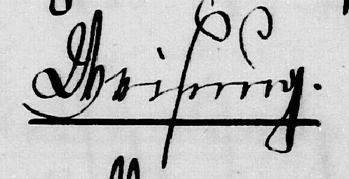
Weisung.
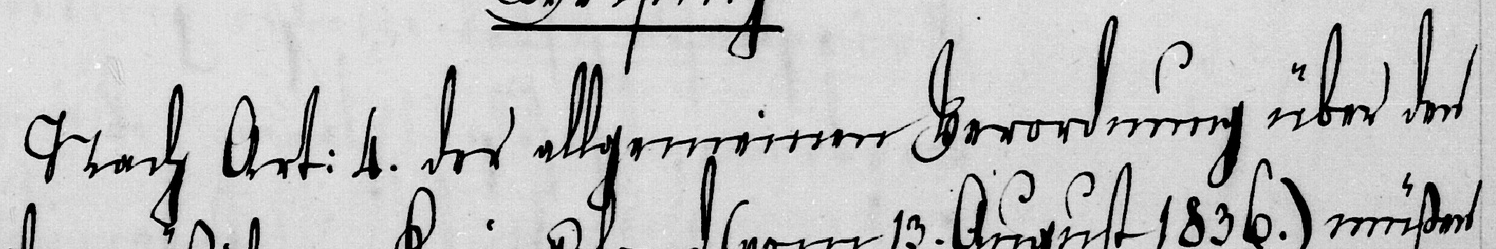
Nach Art: 4. der allgemeinen Verordnung über den
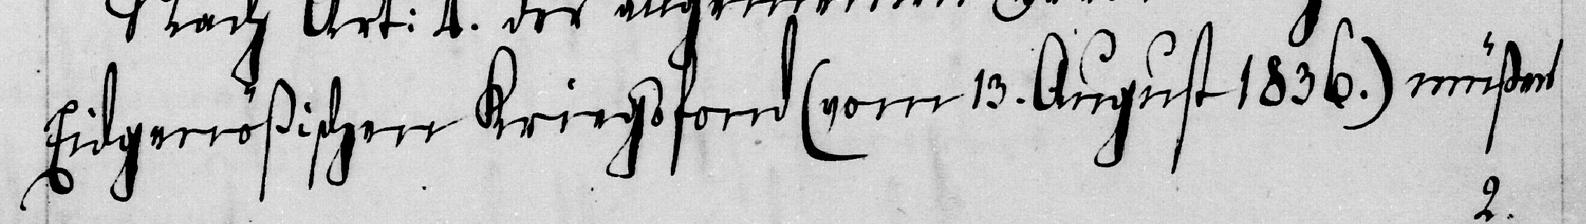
Eidgenößischen Kriegsfond (vom 13. August 1836.) müßen
